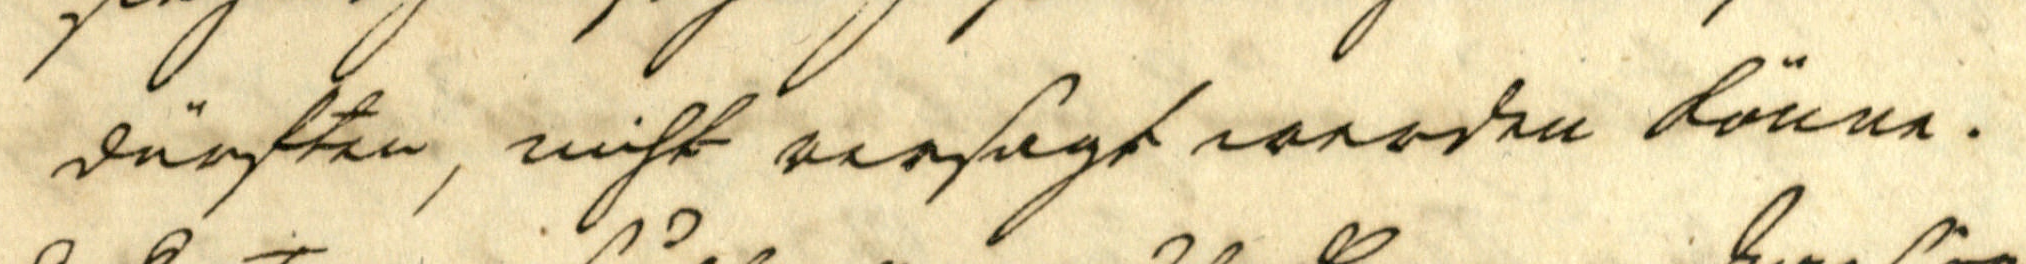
dürften, nicht versagt werden könne.
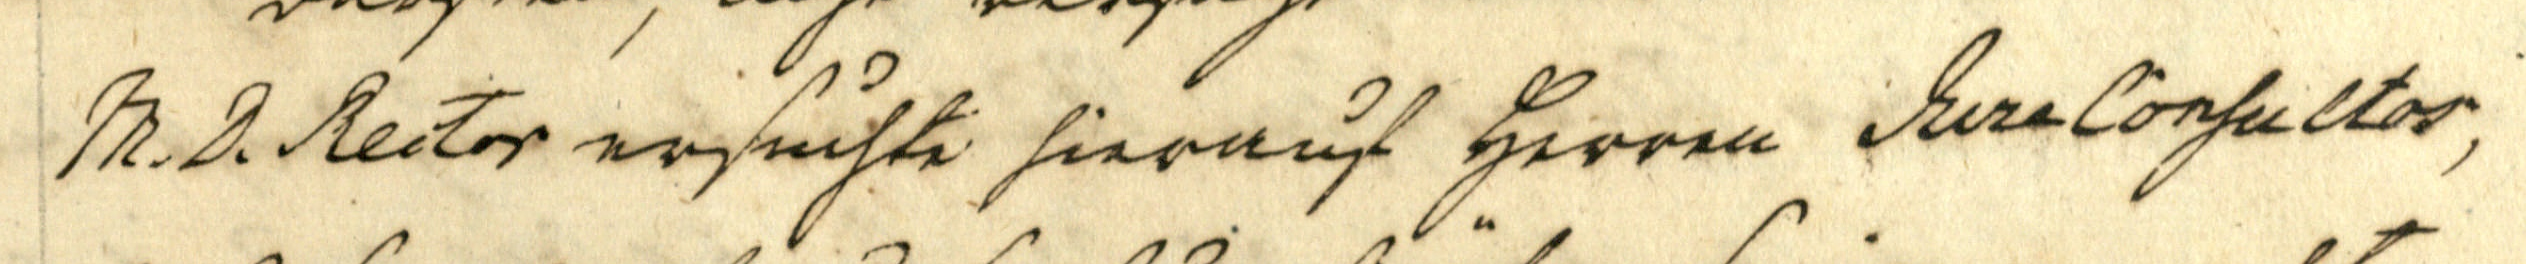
M. D. Rector ersuchte hierauf Herren JureConsultos,
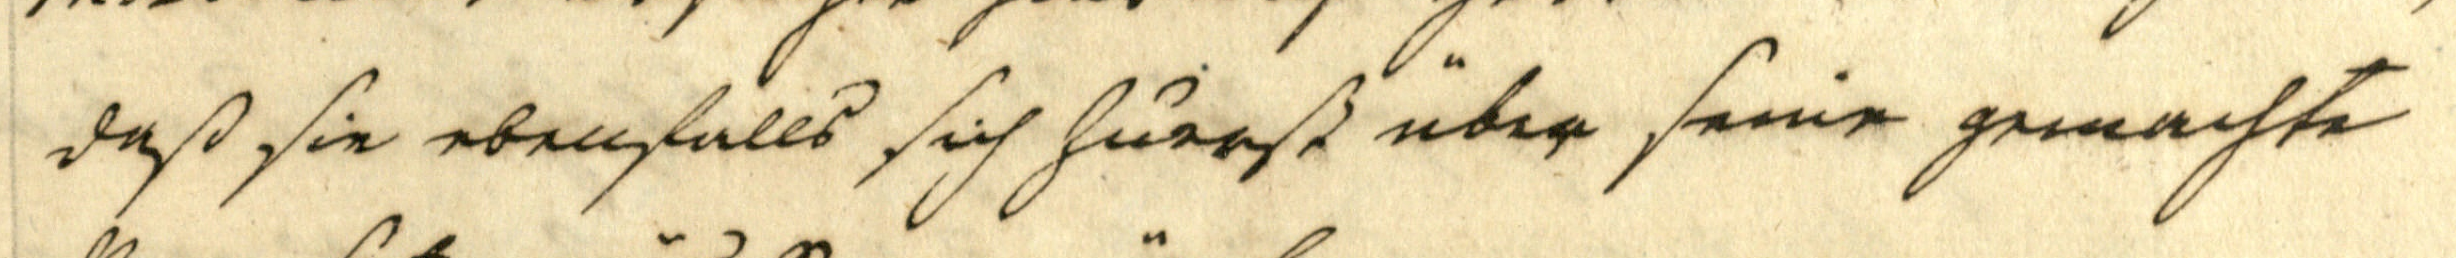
daß sie ebenfalls sich zuerst über seine gemachte
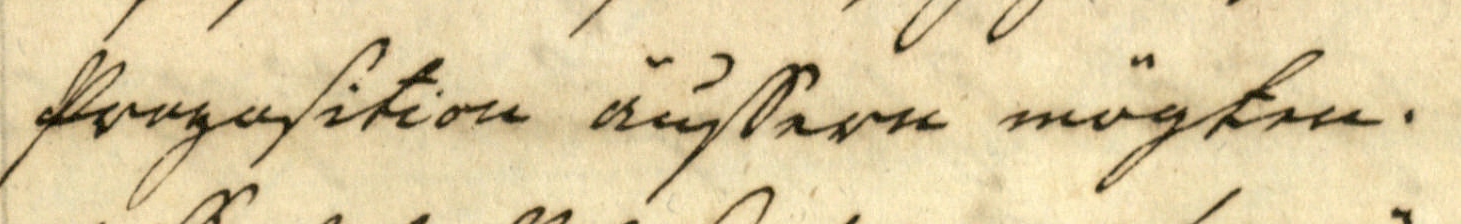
Proposition äussern mögten.
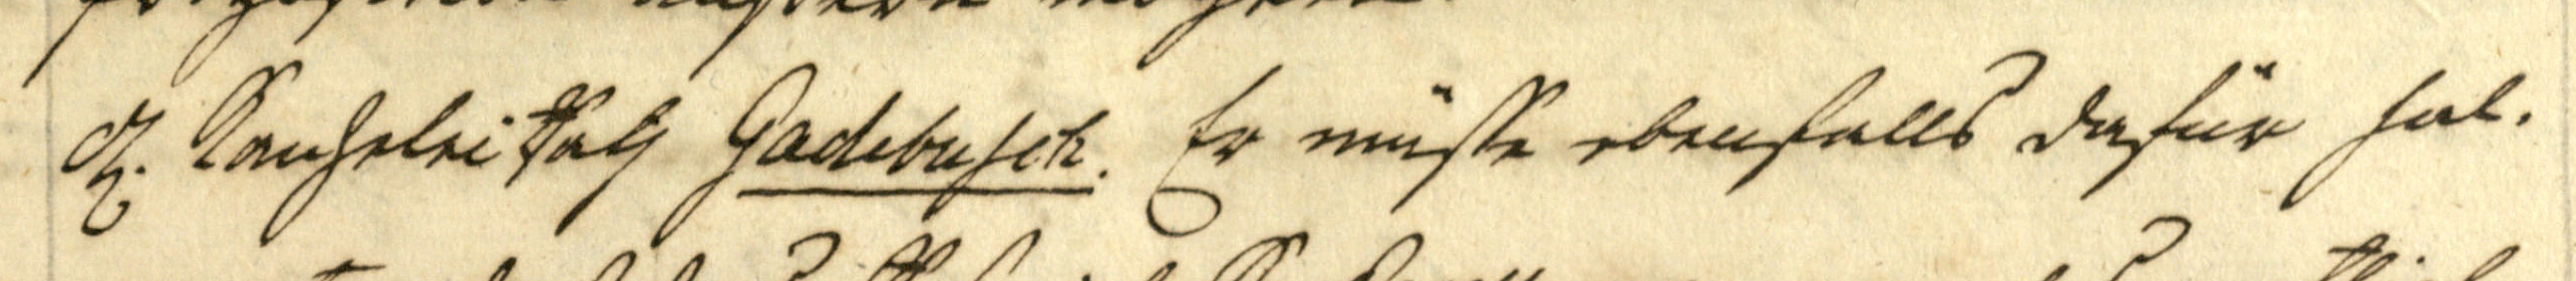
dh. KanzeleiRath Gadebusch. Er müsse ebenfalls dafür hal¬
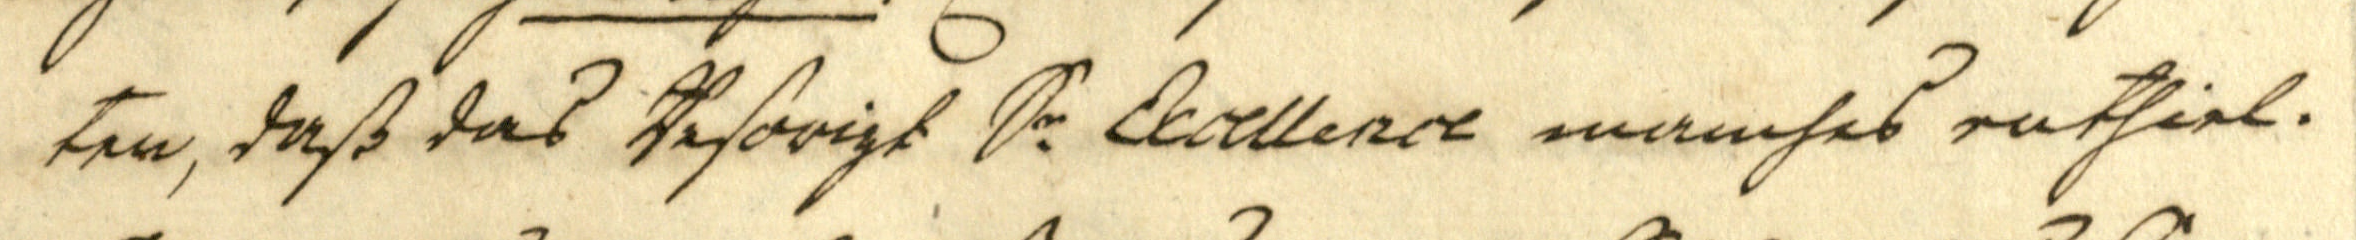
ten, daß das Rescript Sr. Excellence manches enthiel¬
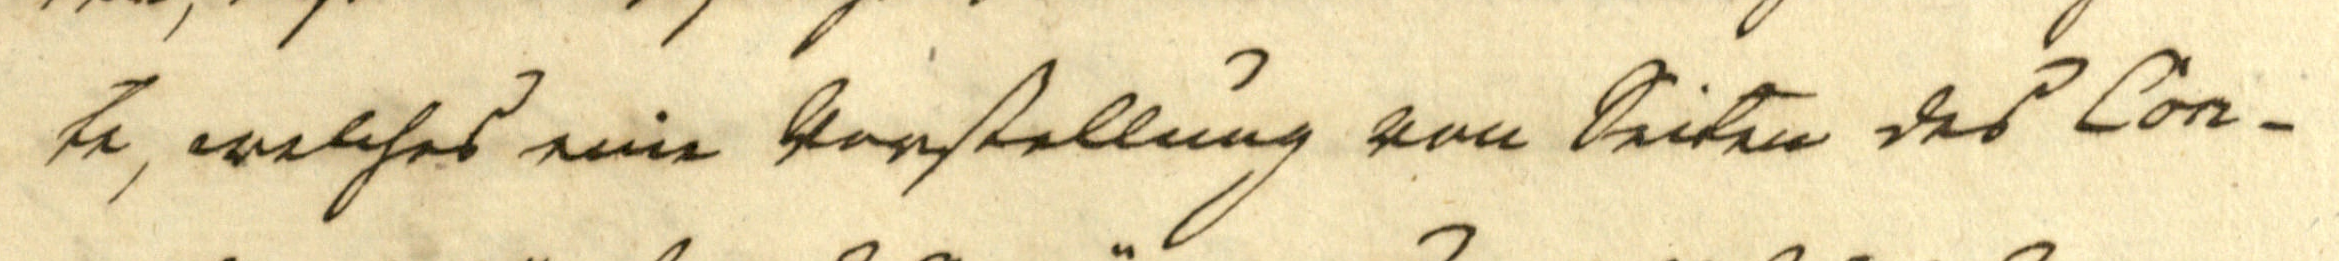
te, welches eine Vorstellung von Seiten des Con¬
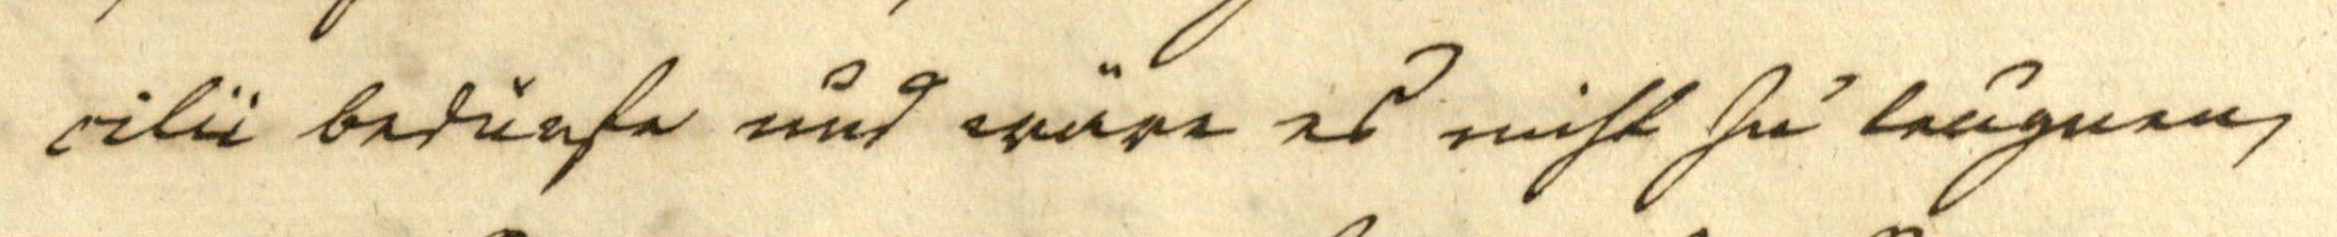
cilii bedürfe und wäre es nicht zu leugnen,
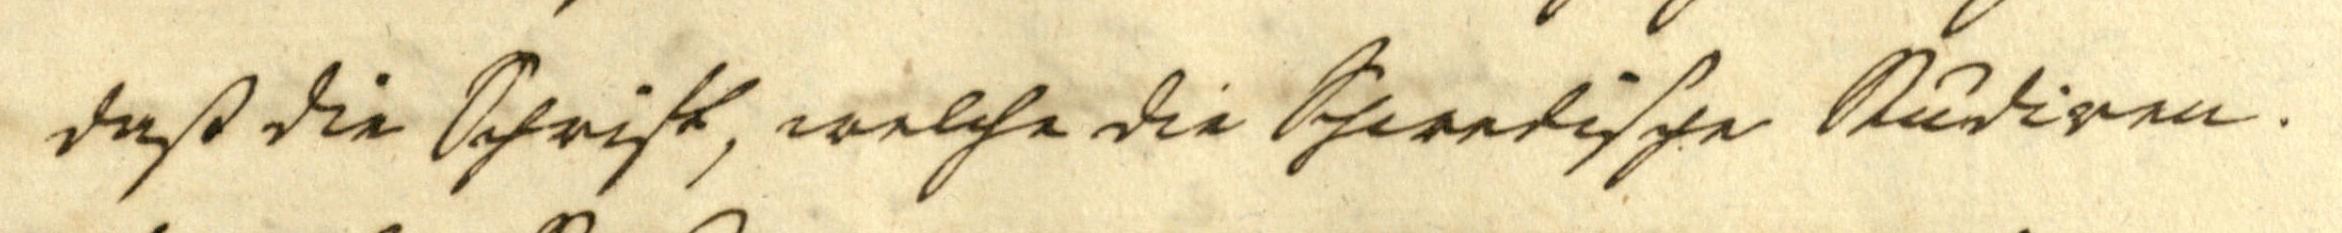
daß die Schrift, welche die Schwedische Studiren¬
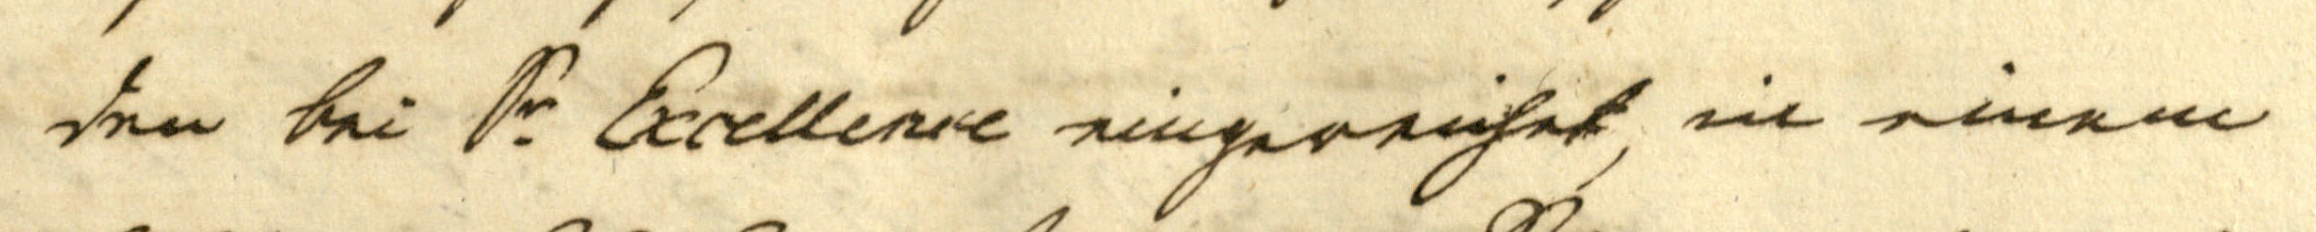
den bei Sr Excellence eingereichet, in einem
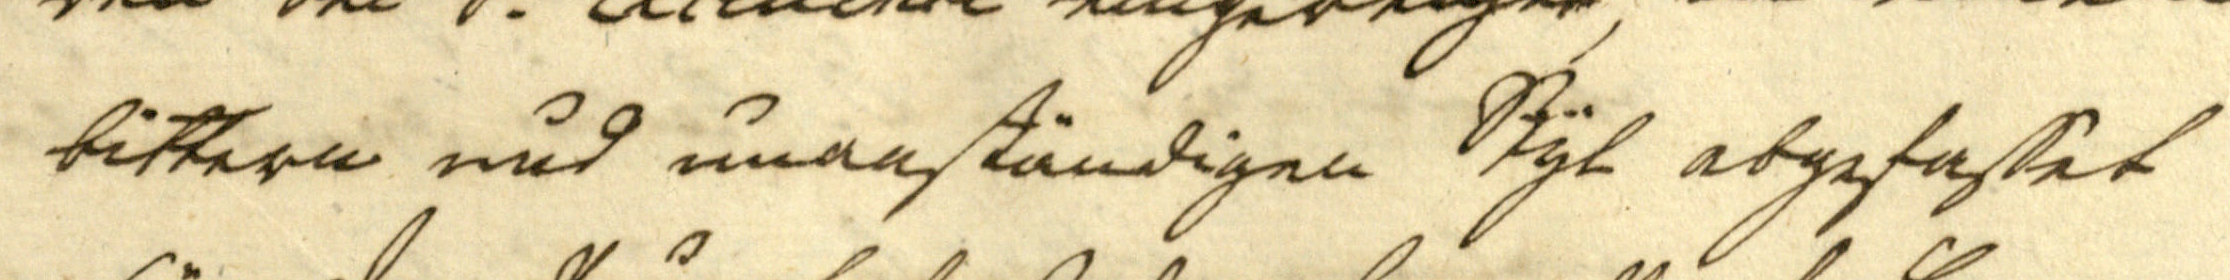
bittern und unanständigen Stÿl abgefasset
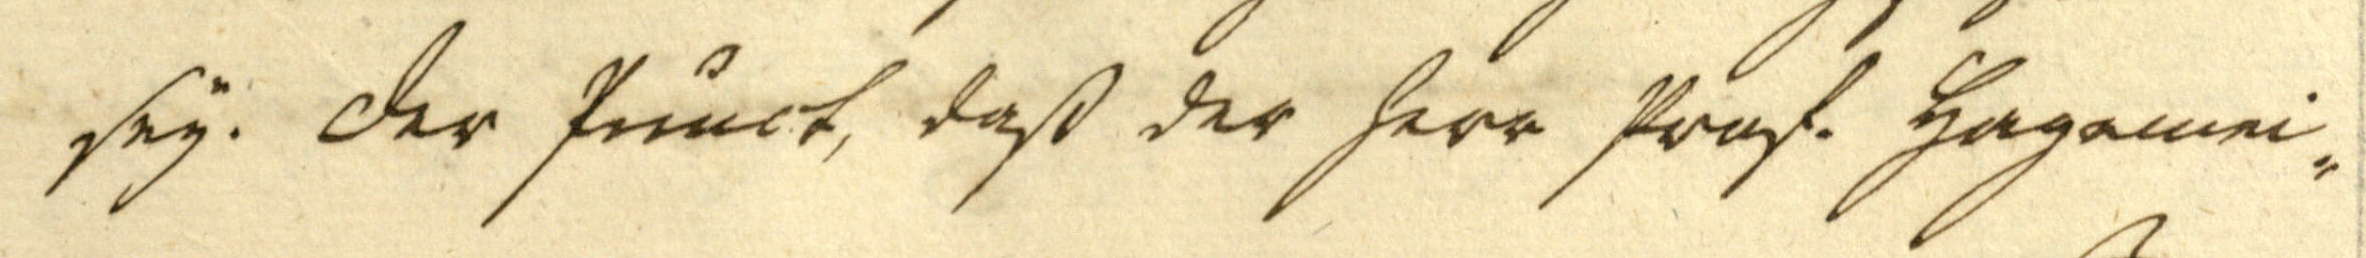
seÿ. Der Punct, daß der Herr Prof. Hagemei¬
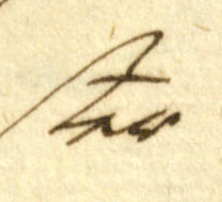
ster
